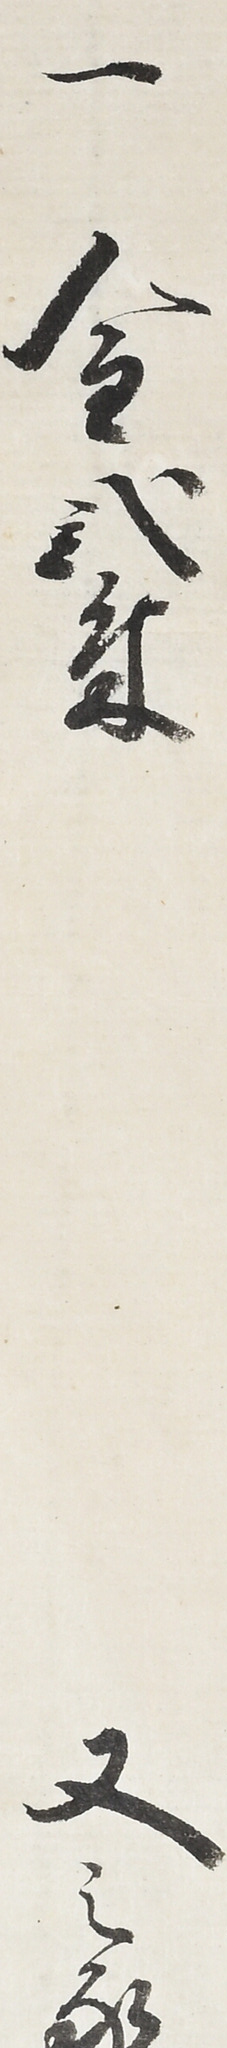一金弐朱又之丞
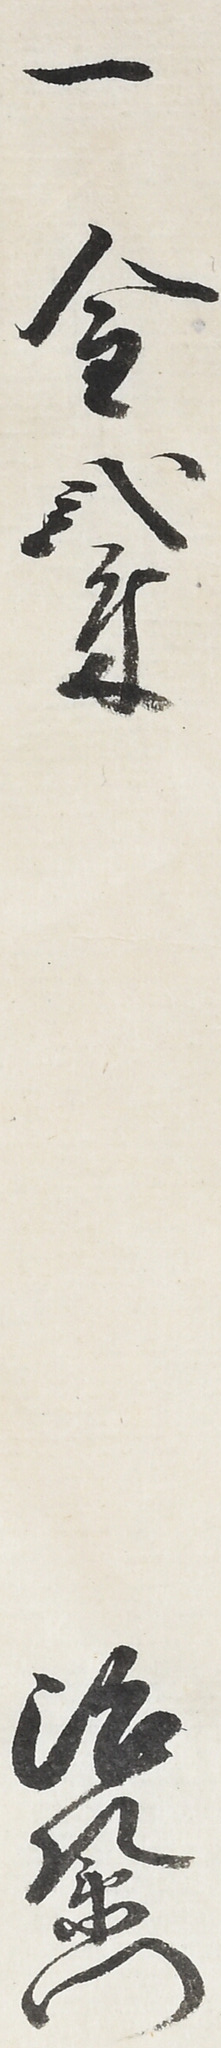一金弐朱治左衛門

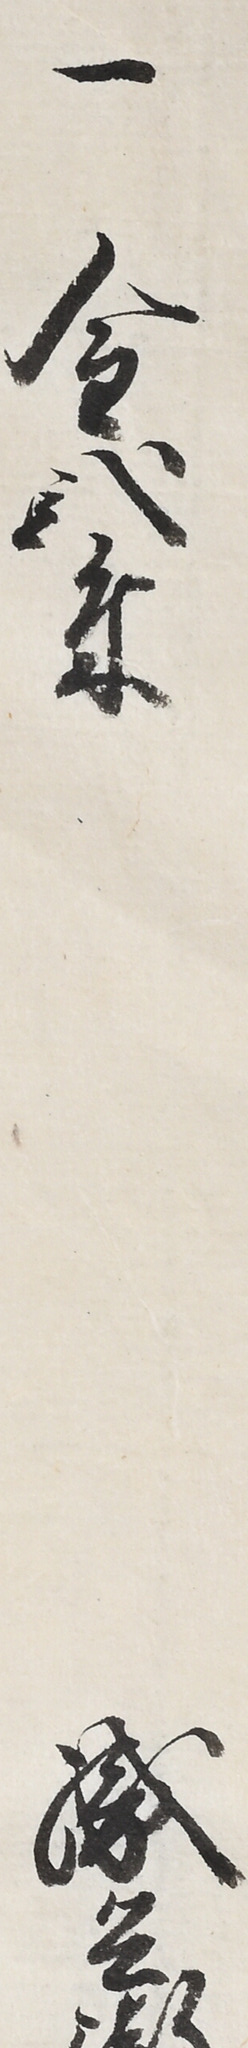一金弐朱織兵衛
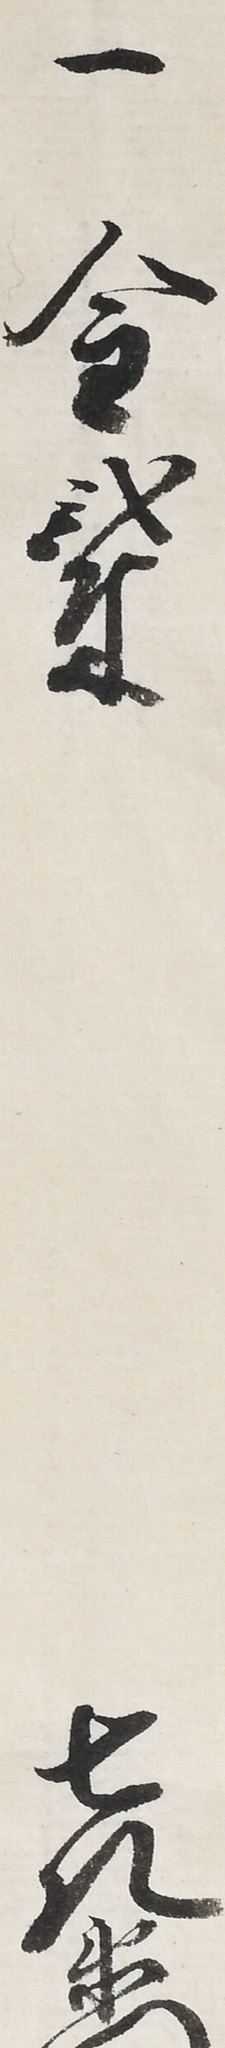一金弐朱七左衛門
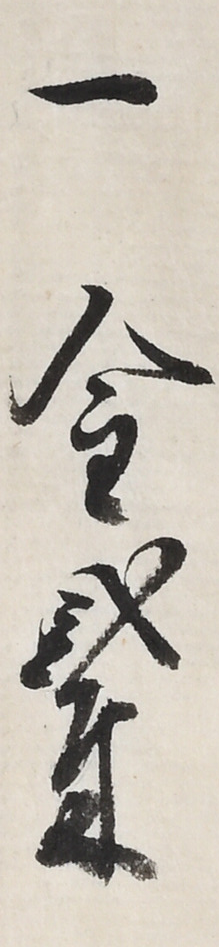一金弐朱善蔵
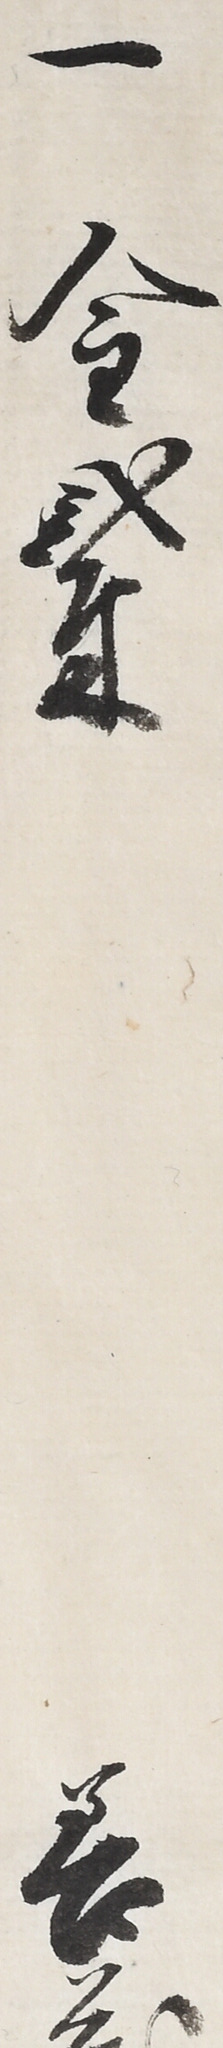一金弐朱善蔵
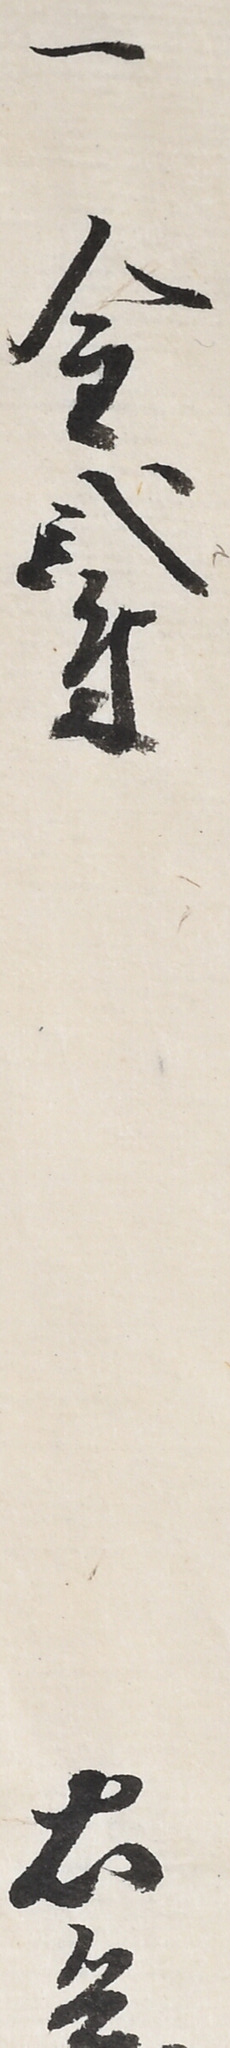一金弐朱文右衛門
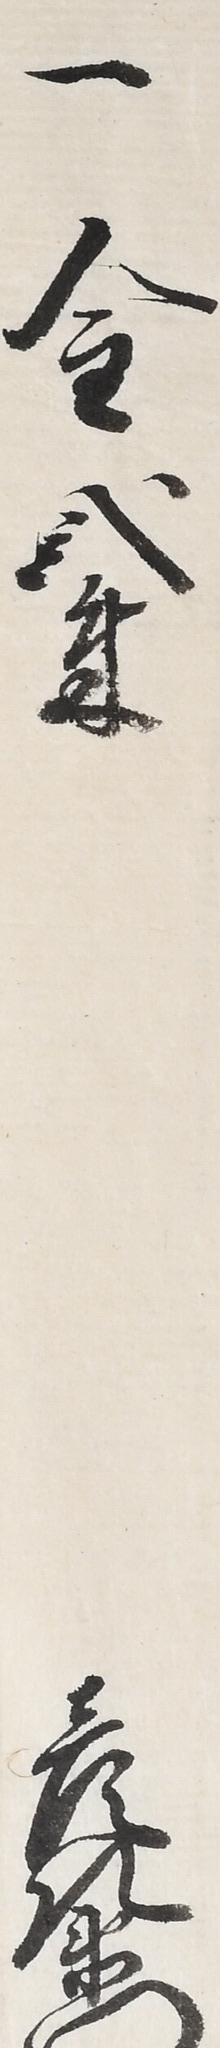一金弐朱彦左衛門
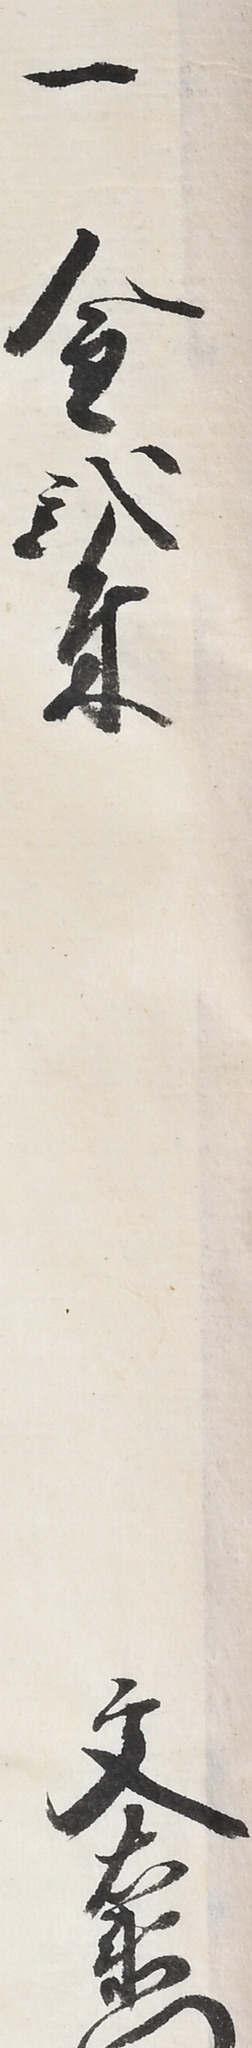一金弐朱文右衛門
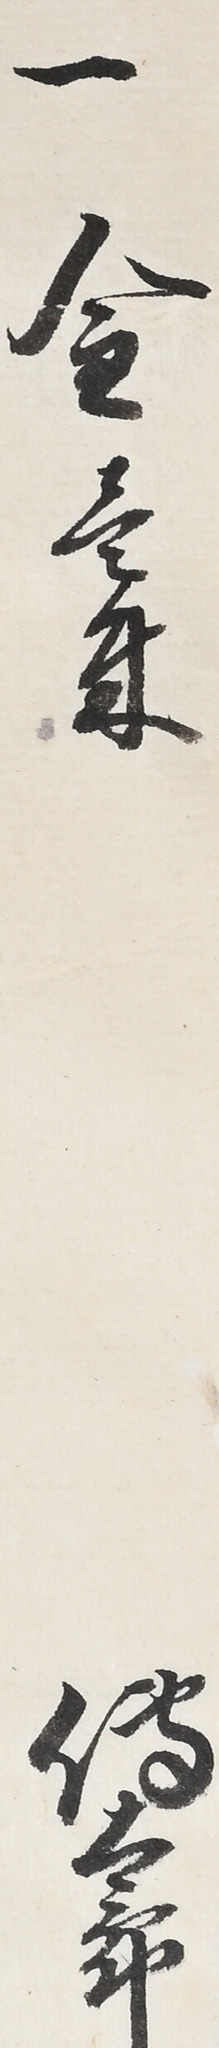一金壱朱伝太郎
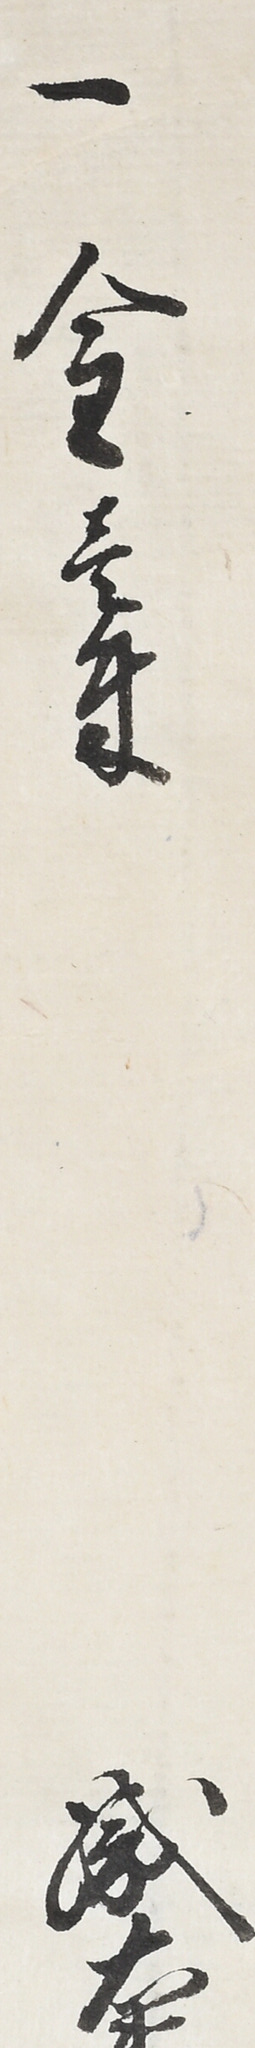一金壱朱吉蔵
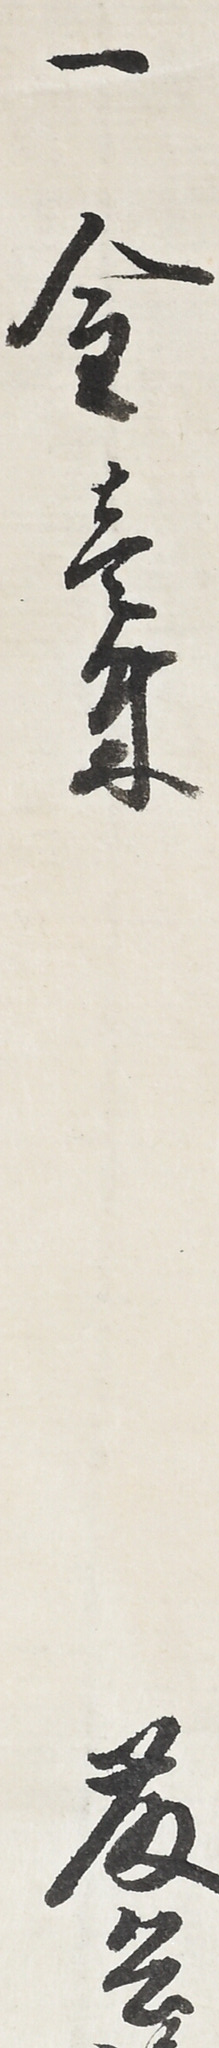一金壱朱藤兵衛
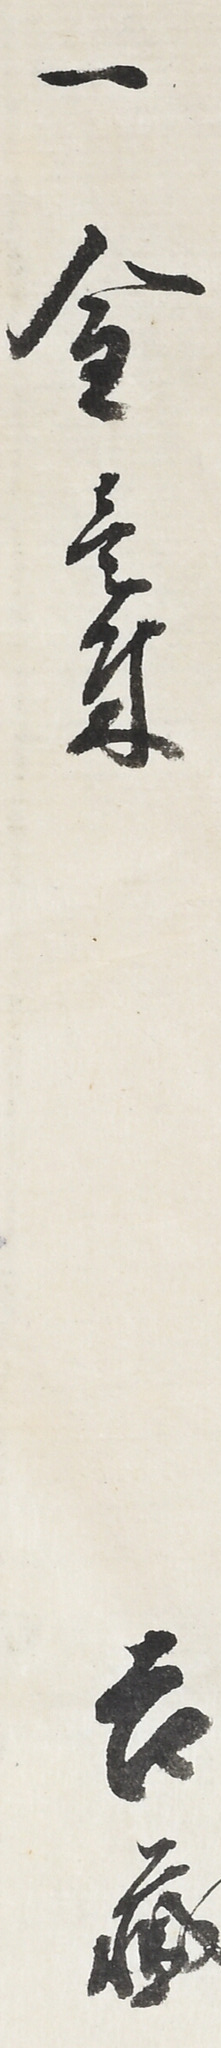一金壱朱吉蔵

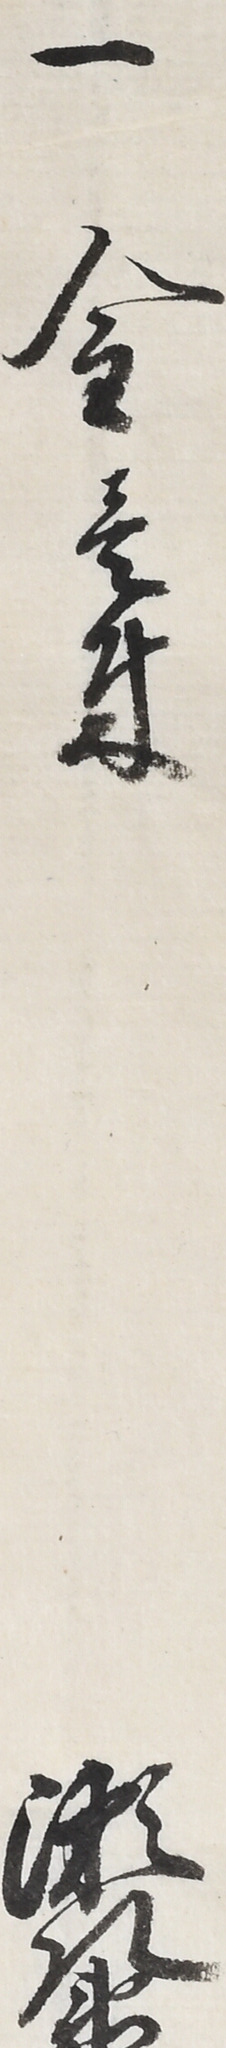一金壱朱瀬左衛門
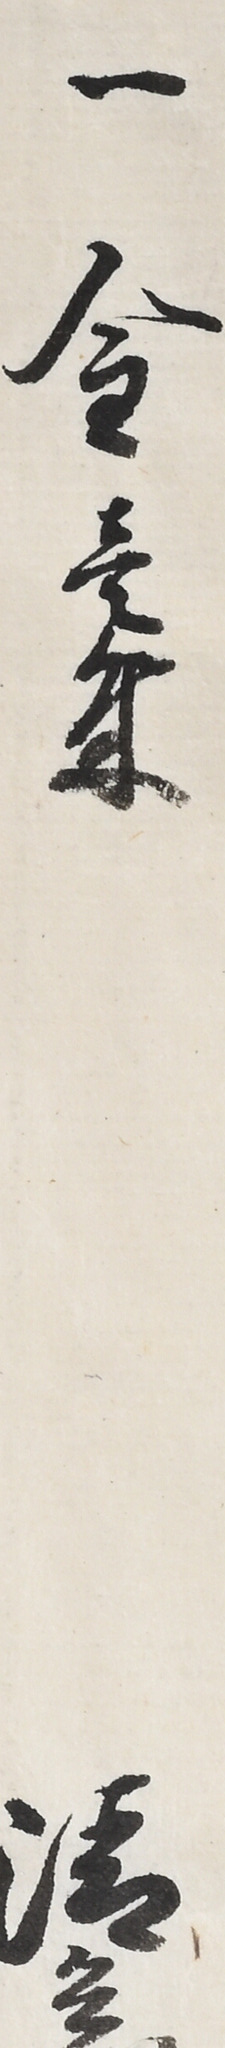一金壱朱清兵衛
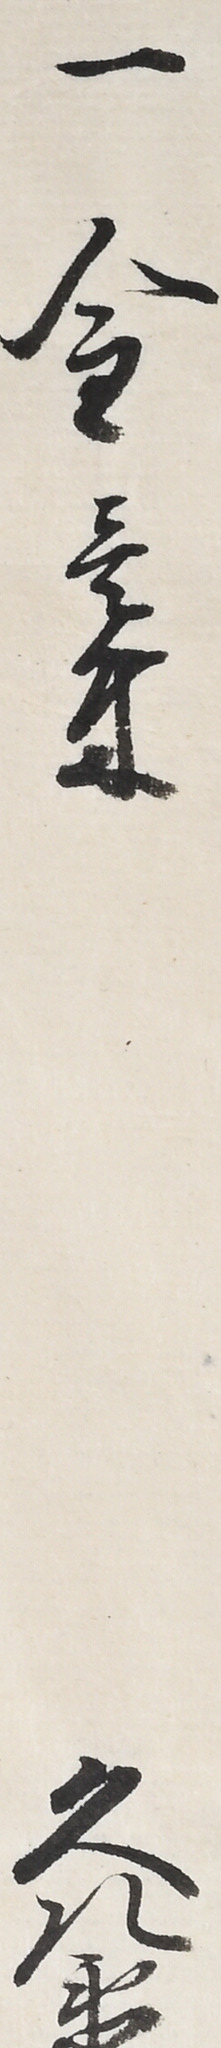一金壱朱久左衛門
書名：御拝地百五拾年御祝儀献上御目録名前
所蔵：伊那市立高遠町図書館・合同会社AMANE
